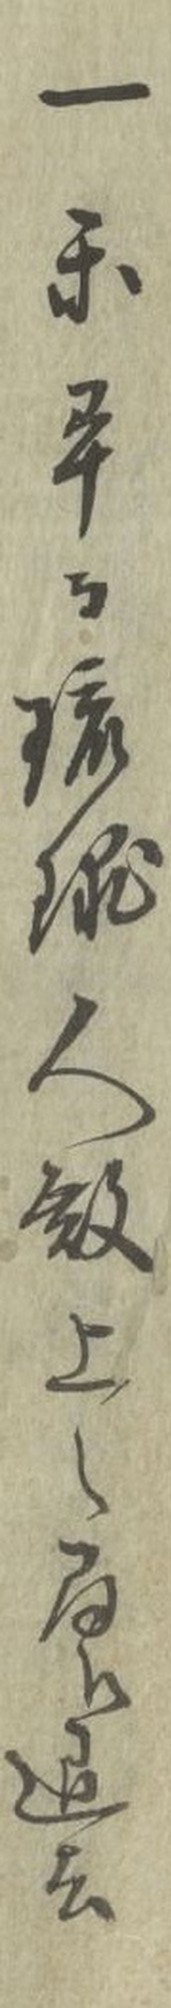一楽畢而琉球人殿上之間え退去
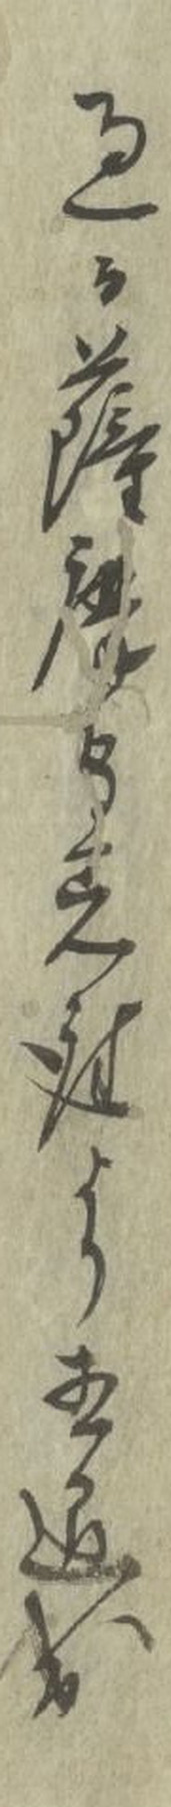過而薩摩守着座より直退出
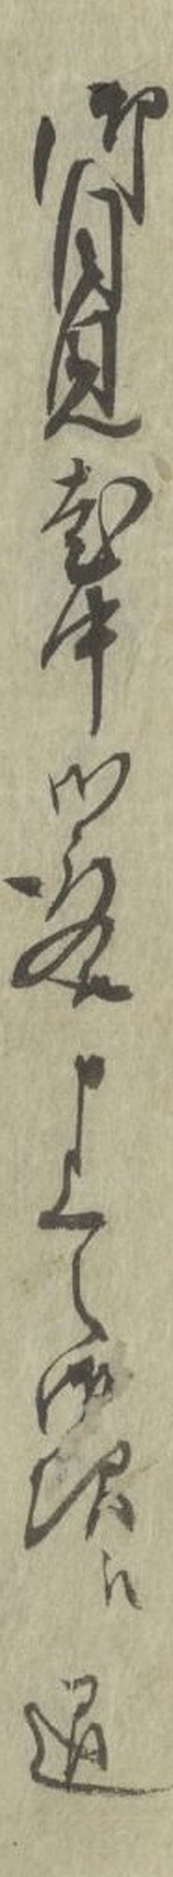御目見老中御取合申上之御次え退

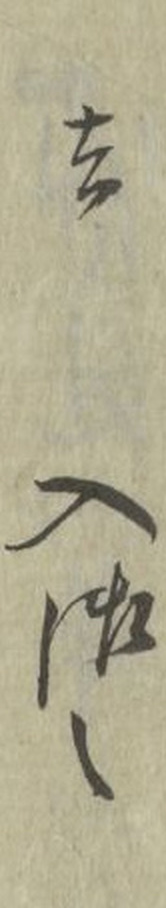去入御之
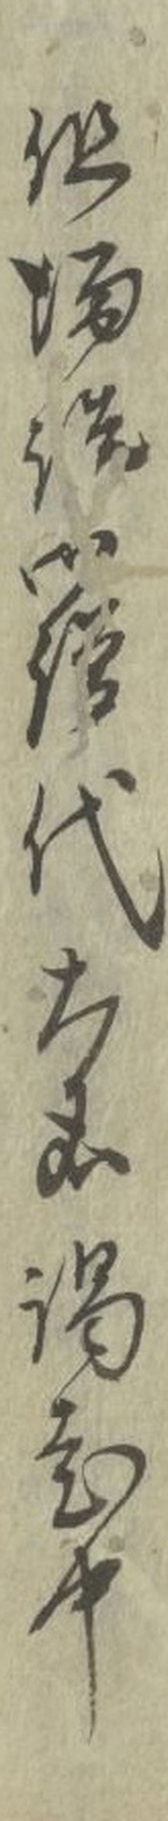但溜詰御譜代大名謁老中
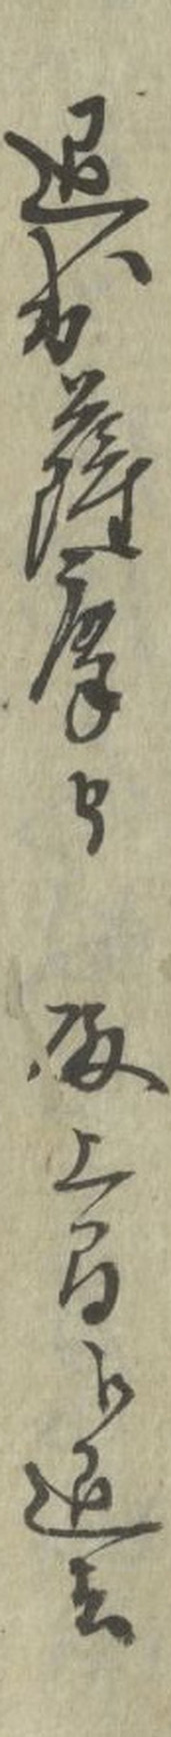退出薩摩守殿上間え退去
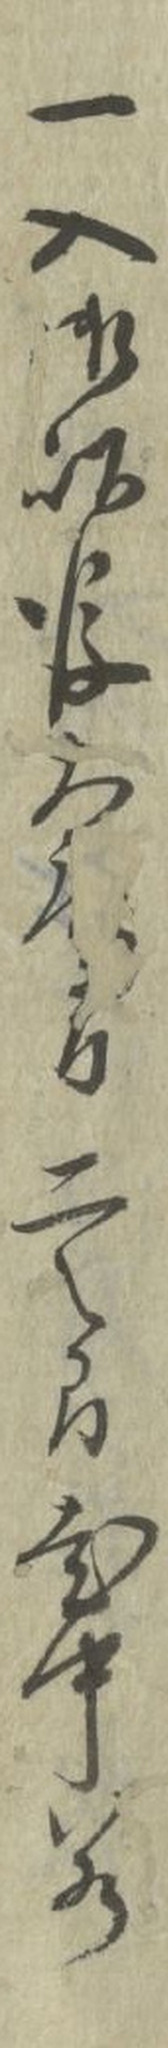一入御以後大広間二之間老中若
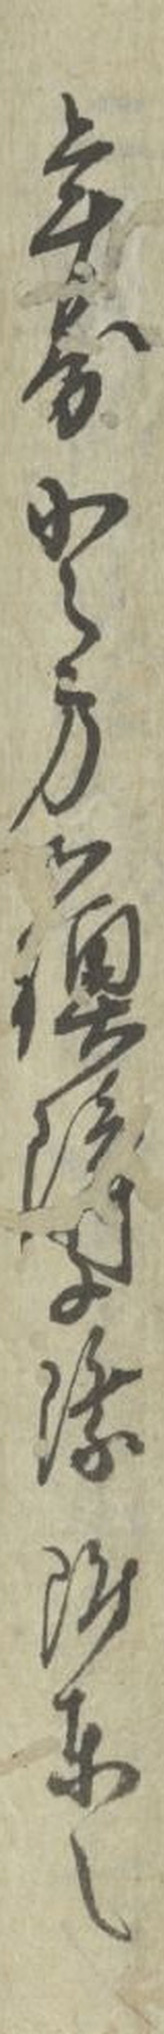年寄北之方御襖障子際附東之
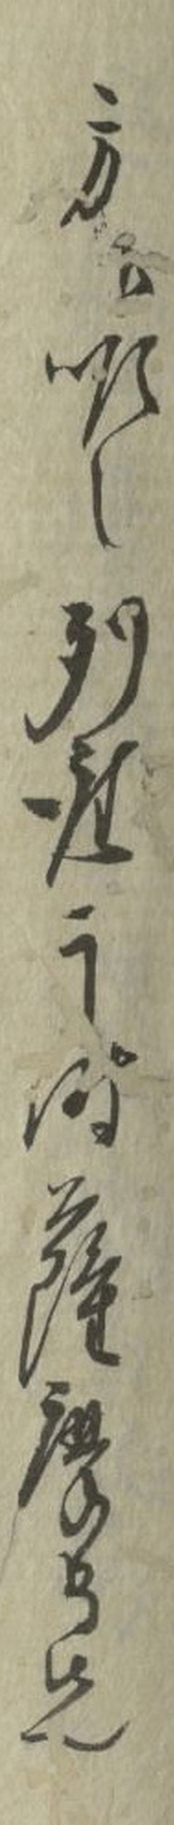方え順之列座于時薩摩守先
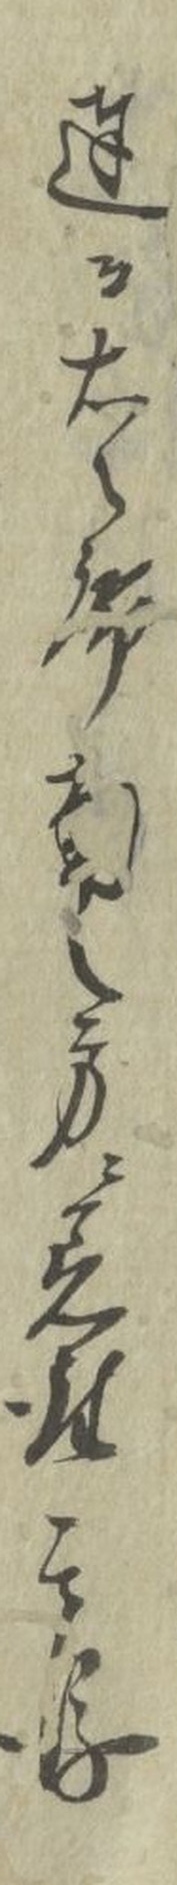達而右之席南之方に着座其後
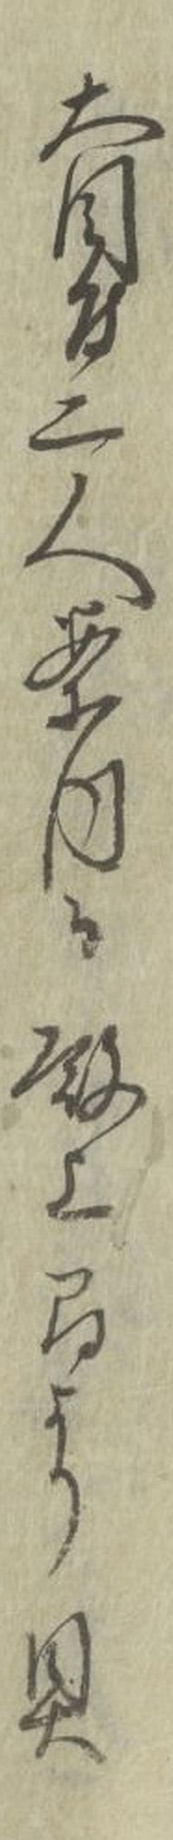大目付二人案内而殿上間より具
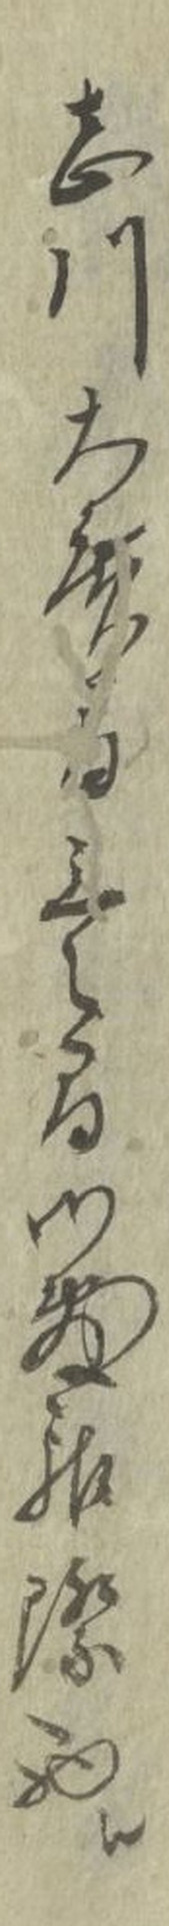志川大広間三之間御敷居際西え
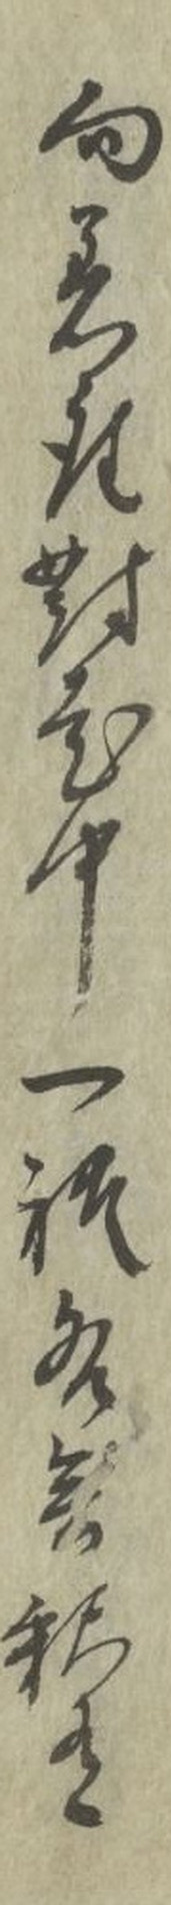向着座対老中一礼有会釈有

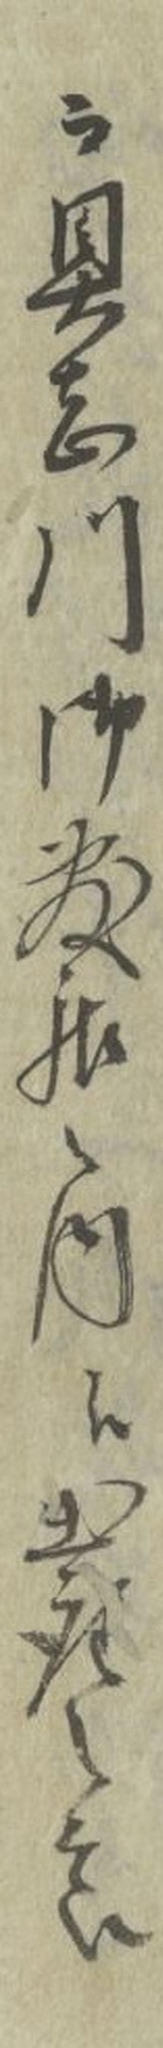而具志川御敷居之内え出座之節
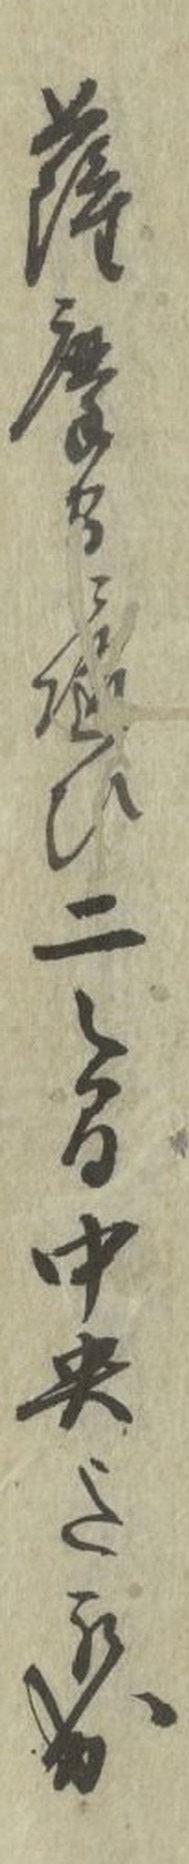薩摩守に随ひ二之間中央迄罷出
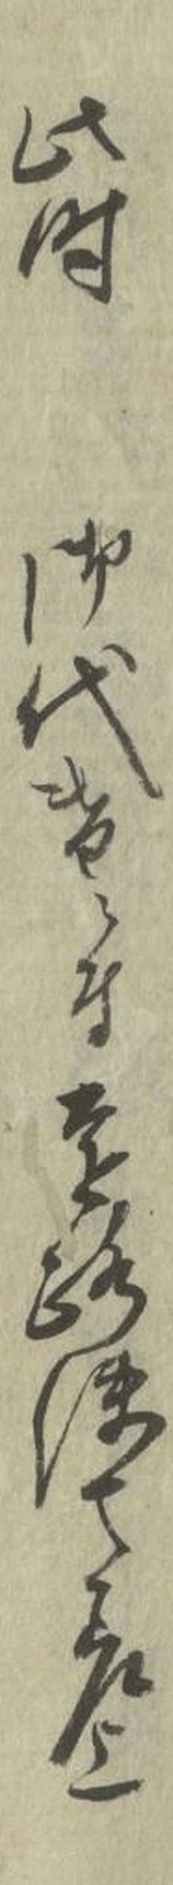此時御代替に付遠路使者差上
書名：琉球来朝記 自八至十四終
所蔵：University of the Ryukyus Library
